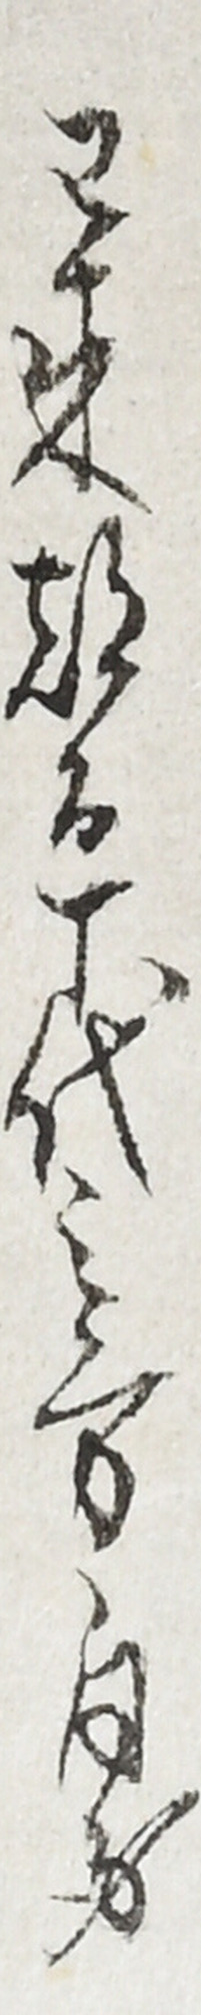已来都而丁代之方自身
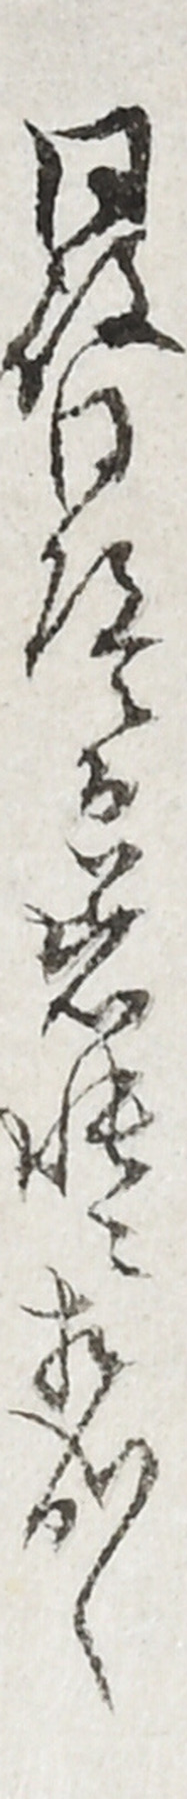同役同道ニ而着帳ニ相成候
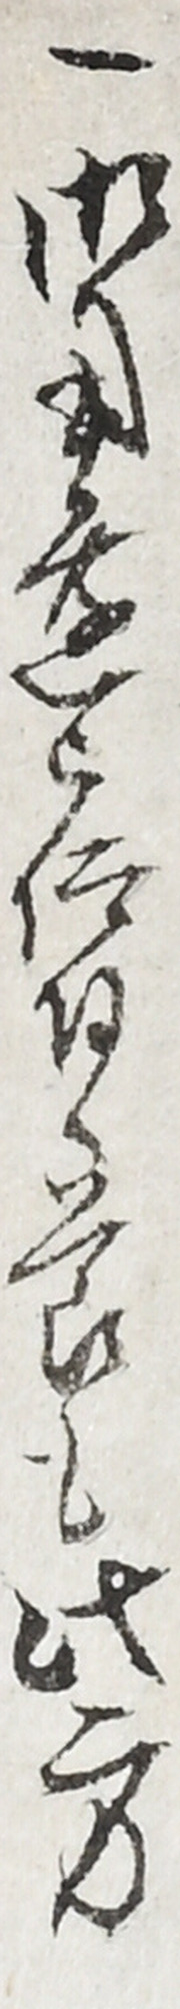一御用意被仰付候節も此方
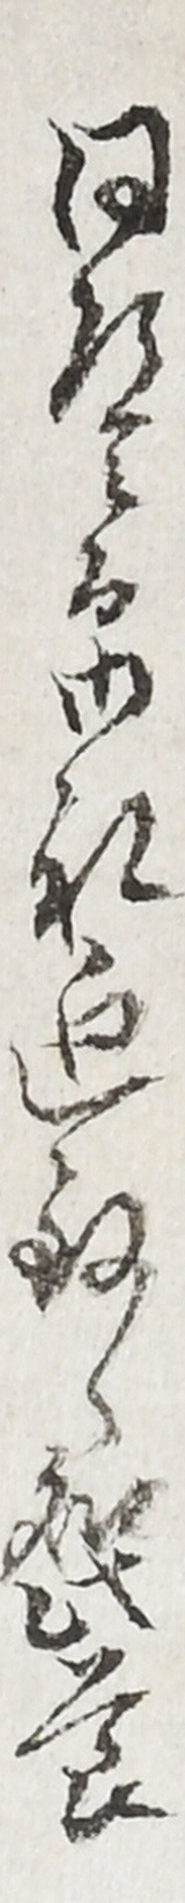同道ニ而御礼廻致候処此節
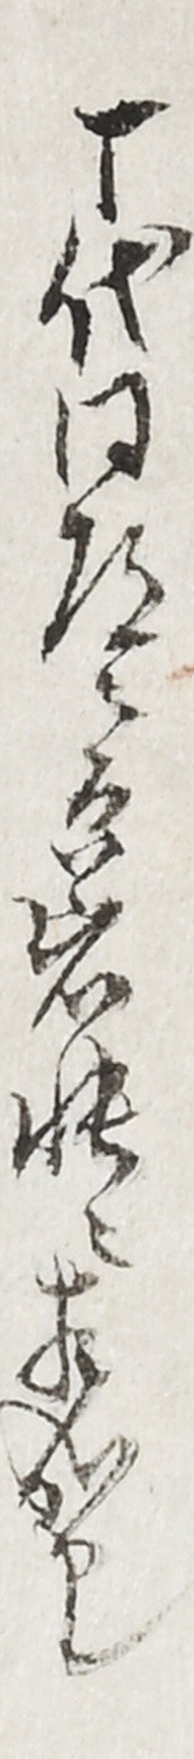丁代同道ニ而着帳に相成申候
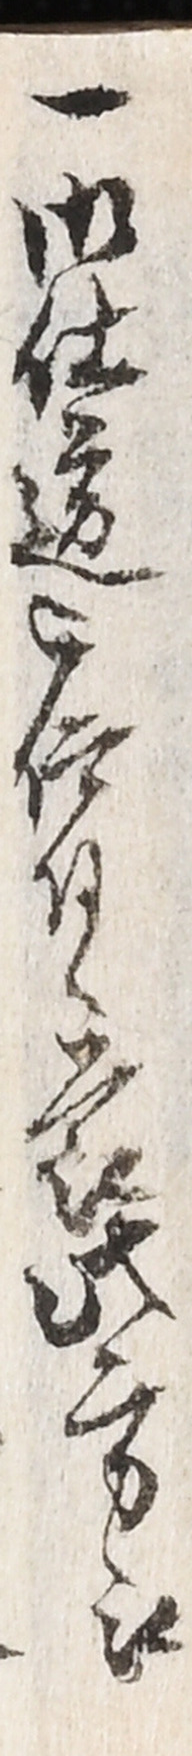一御仕送被仰付候節此方被
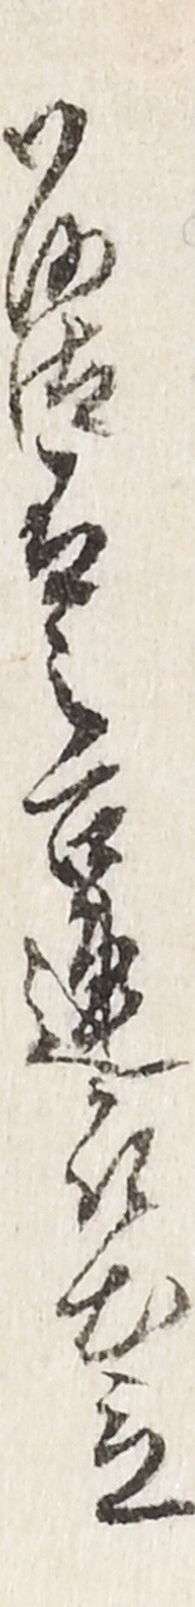御沙汰有之召連名出立
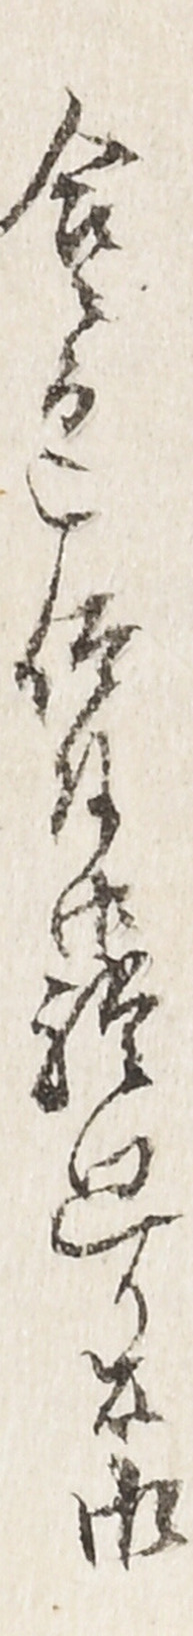合ニ而被仰付御礼廻り右御
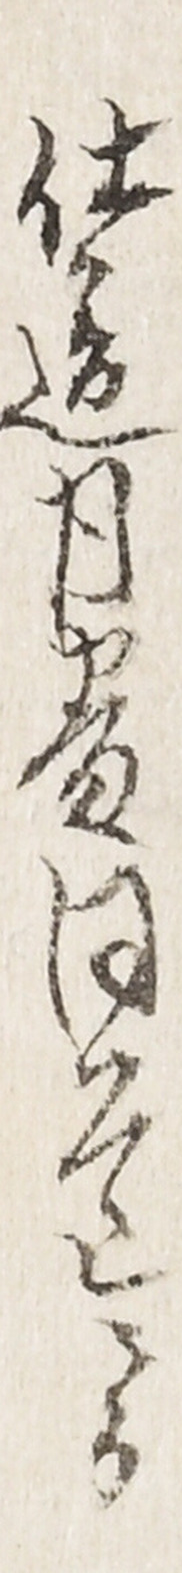仕送月番同道ニ而
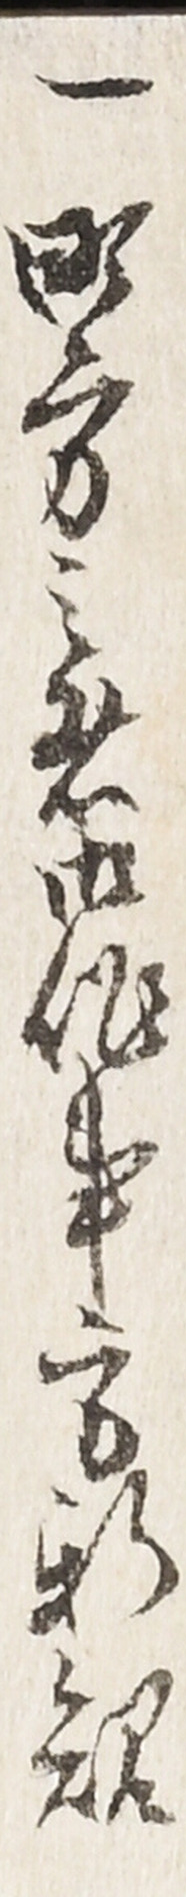一町方之者御作事方新規
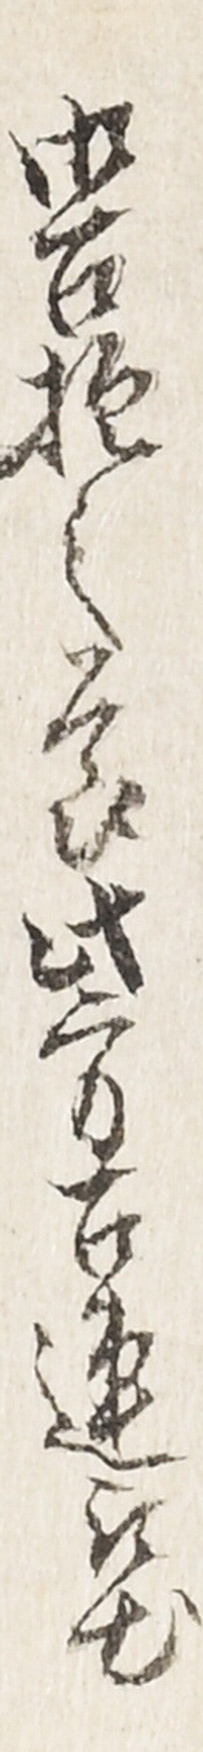御召抱之節此方召連被出
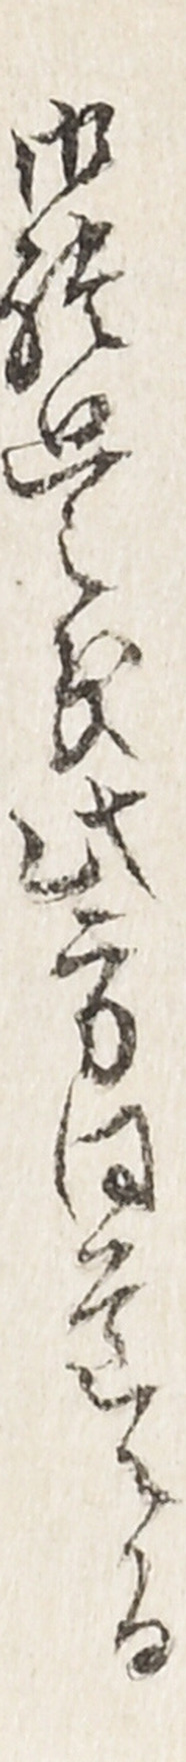御礼廻之義此方同道ニ而
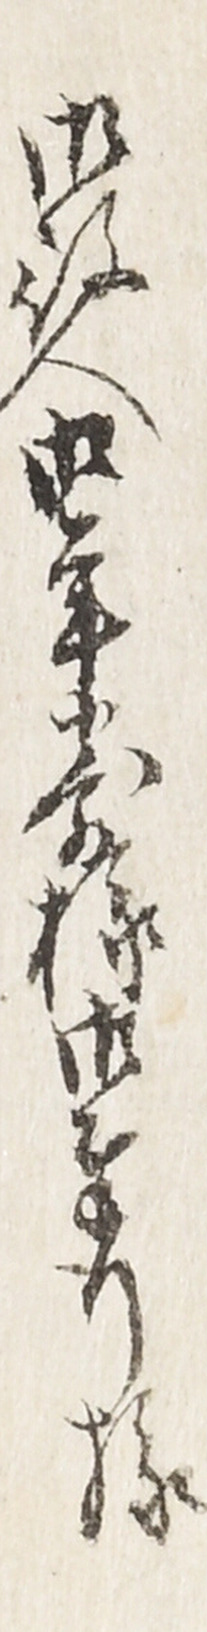御役人御年寄様御奉行様
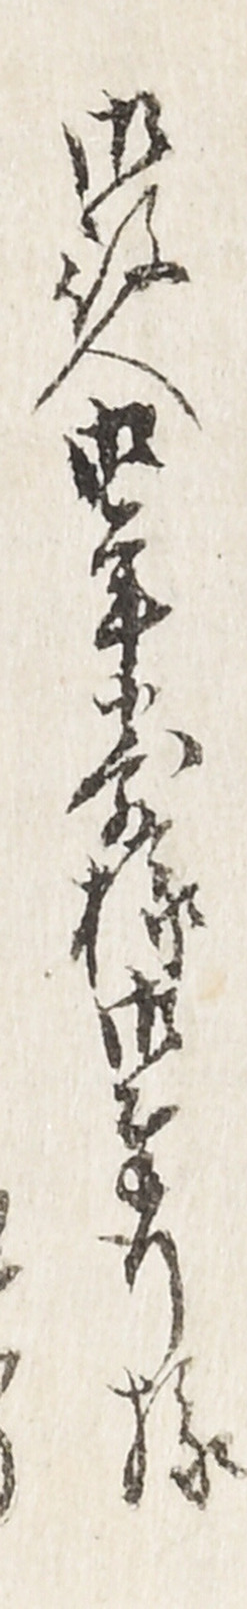御役人御年寄様御奉行様
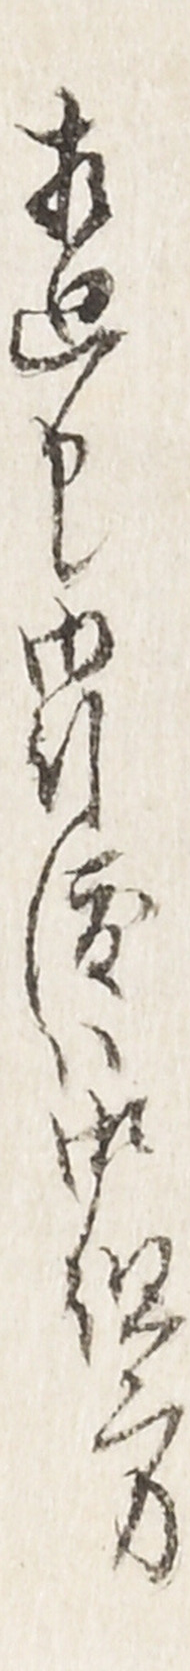相廻申候御引渡ハ御組方
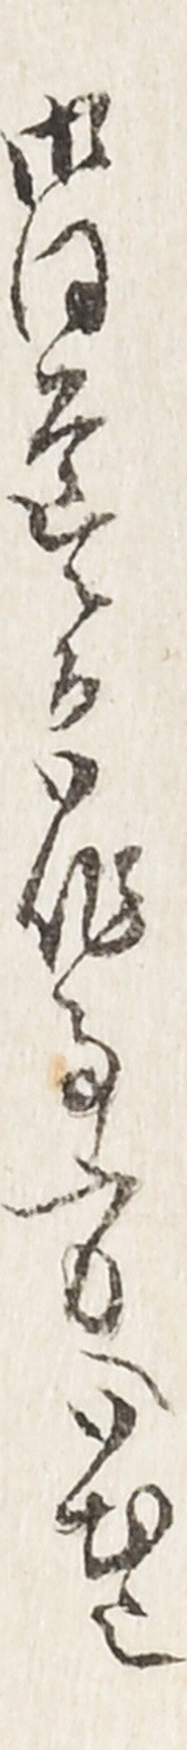御同筆ニ而御作事方へ御出し
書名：年内行事懐中録
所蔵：伊那市立高遠町図書館・合同会社AMANE
